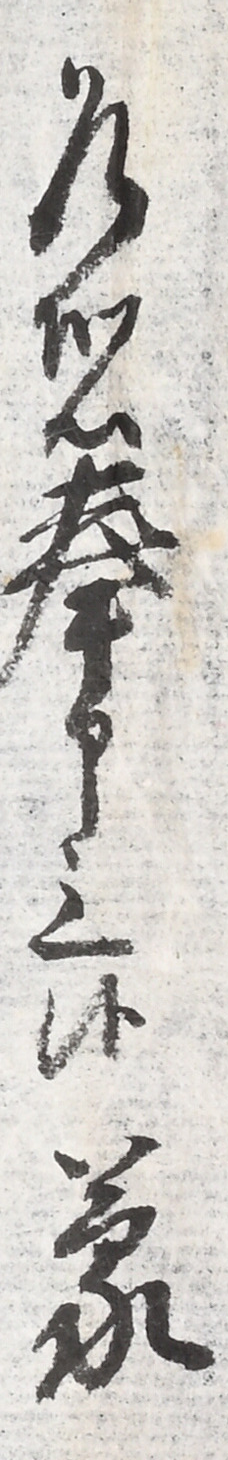乍恐奉申上候蒙
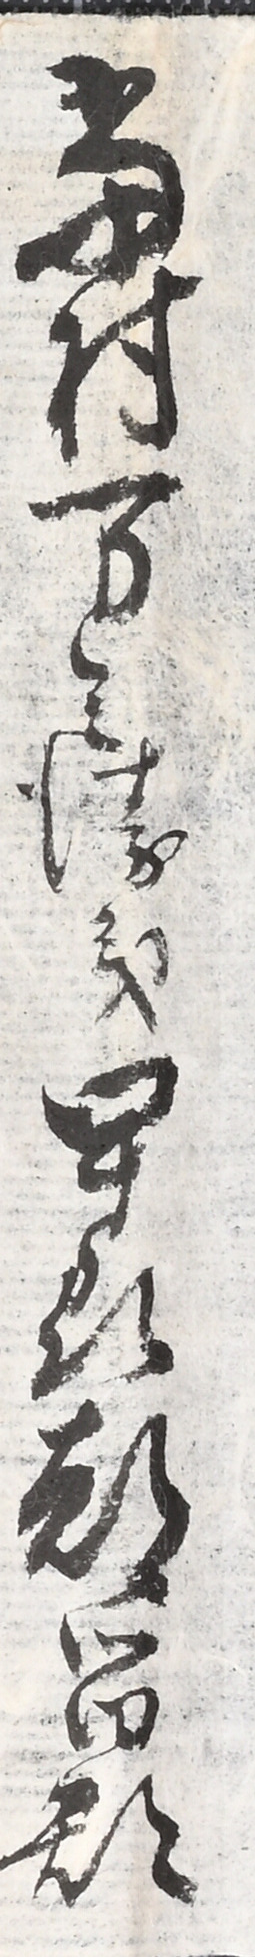当村万兵衛義甲州都留郡
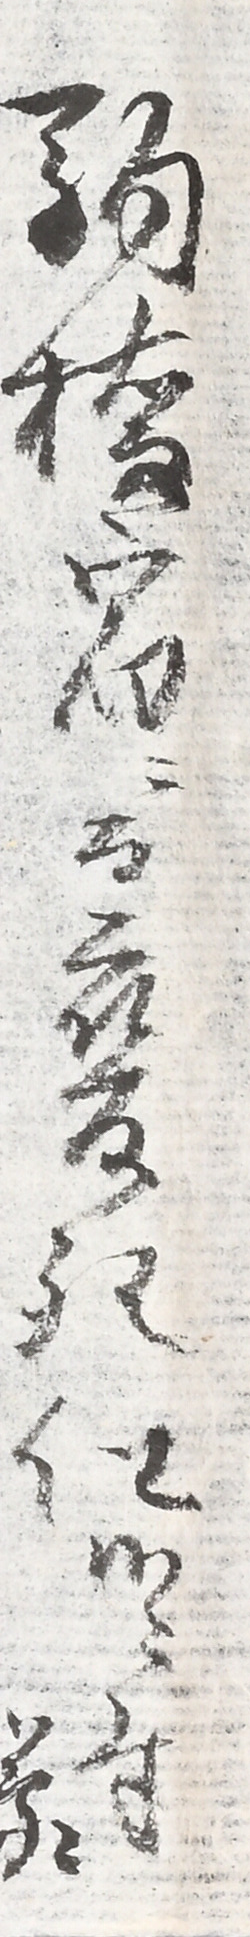駒橋宿ニ而変死仕候ニ付蒙
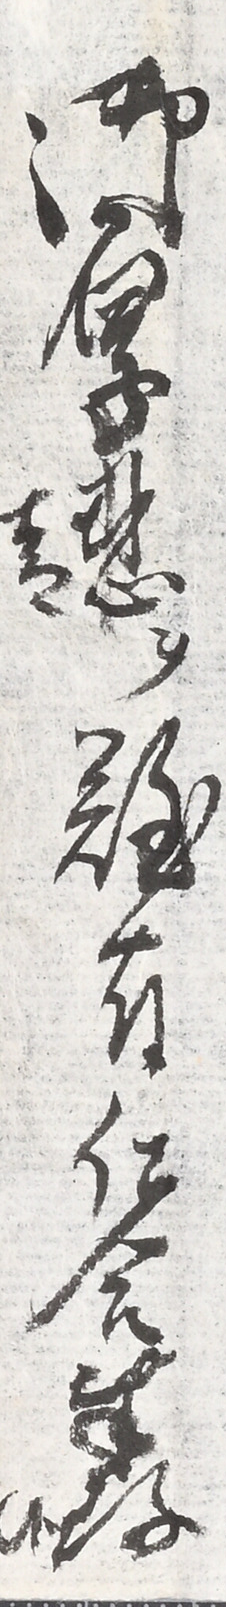御厚悲ヲ難有仕合奉存候
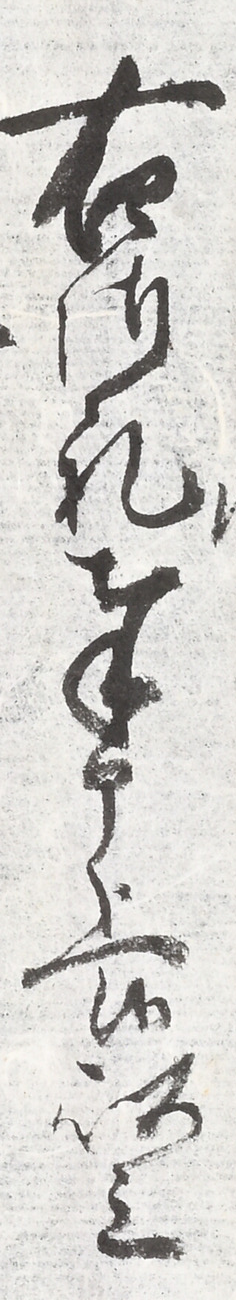右御礼奉申上候以上
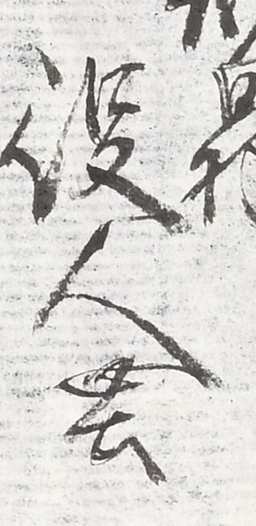役人共
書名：乍恐以奉申上候
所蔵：伊那市立高遠町図書館・合同会社AMANE
